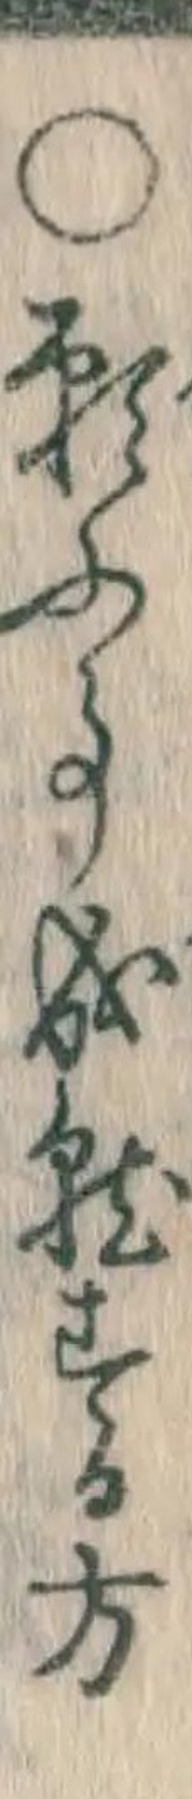○願ふ事成就する方
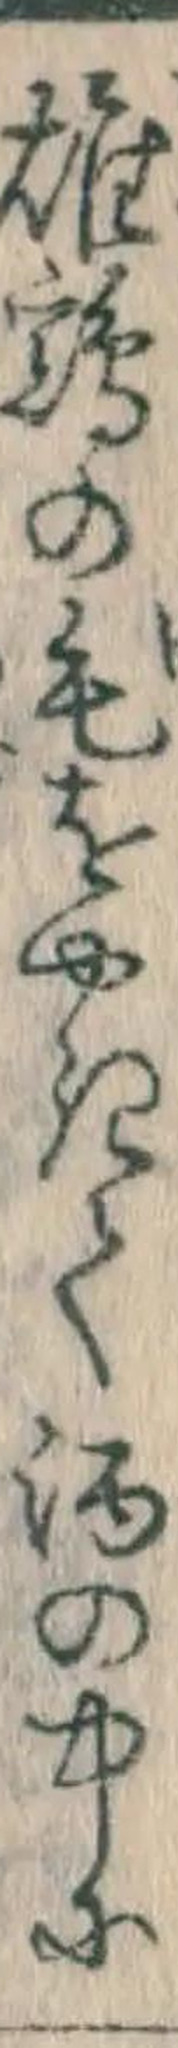雄鶏の毛をやきて酒の中に
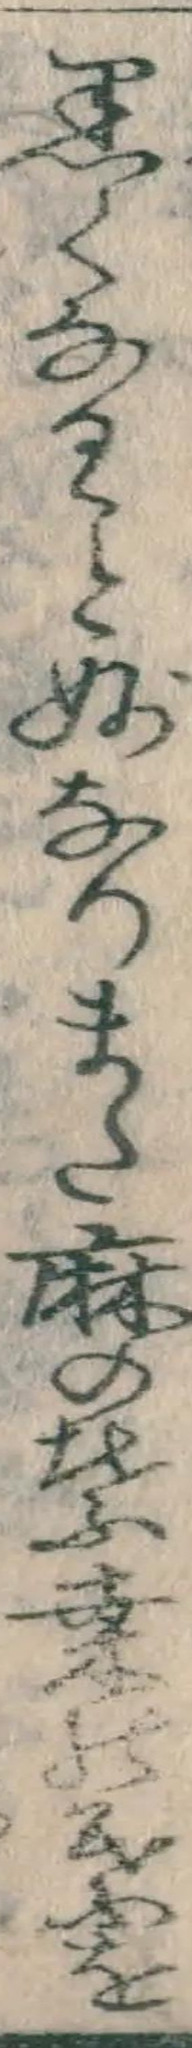黒くなること妙なりまた麻の葉桑の葉を
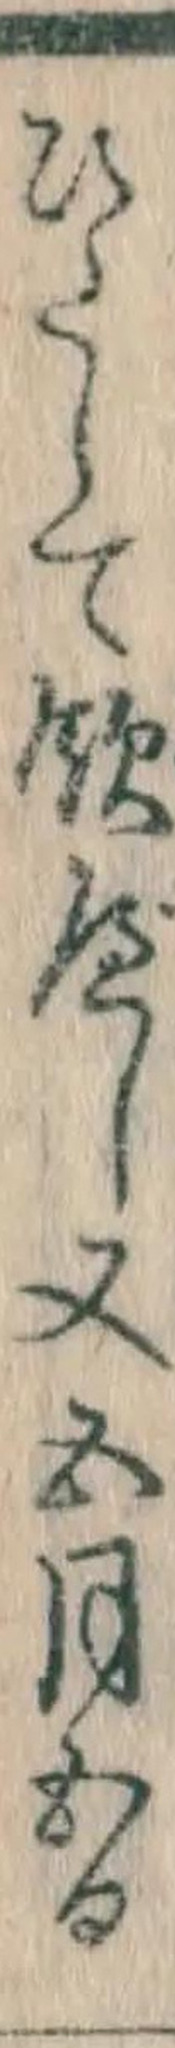ひたして飲べし又五月五日
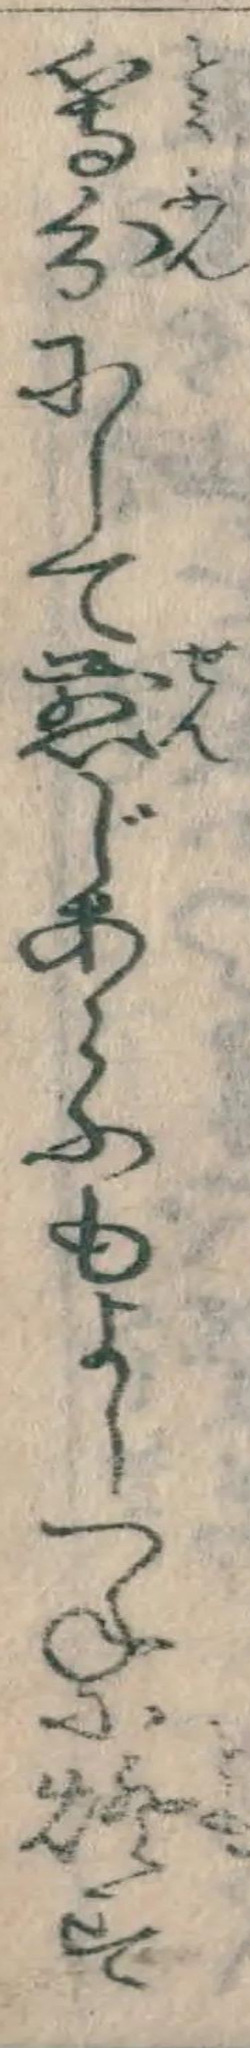等分にして煎じあらふもよしつねに灯す

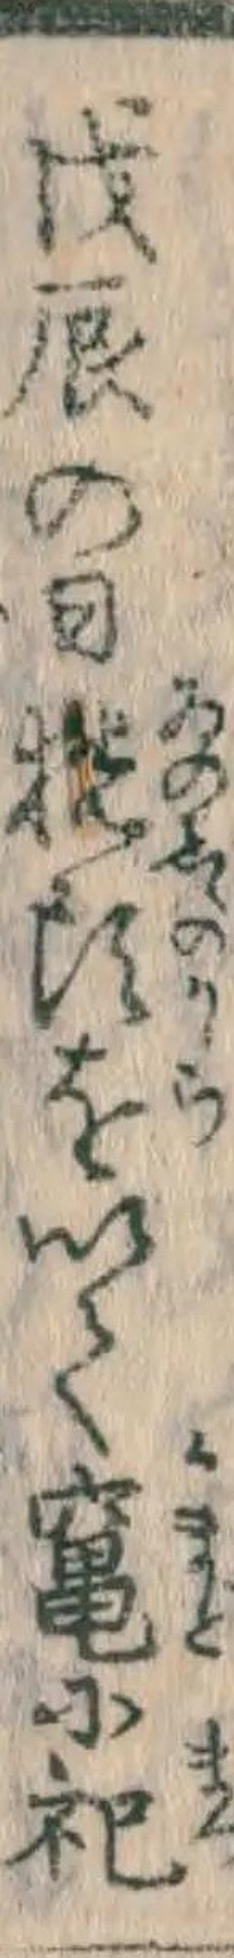戊辰の日猪頭を以て竈に祀
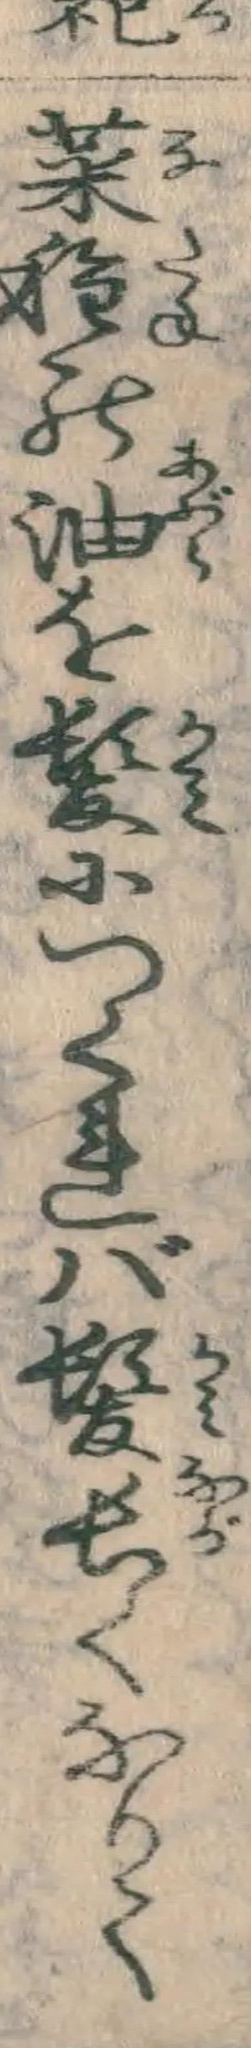菜種の油を髪につくれば髪長くなりて
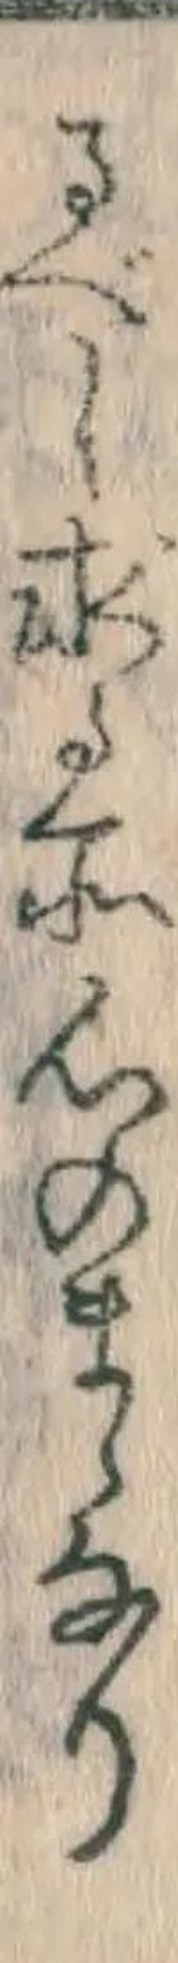るべし求る所心のまゝなり
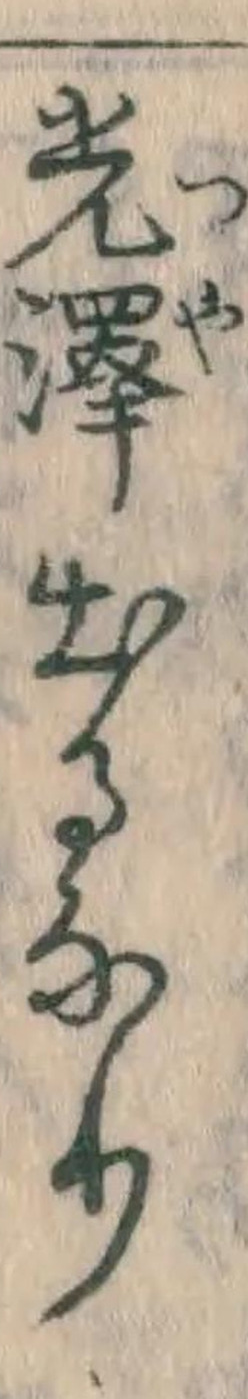光沢出るなり
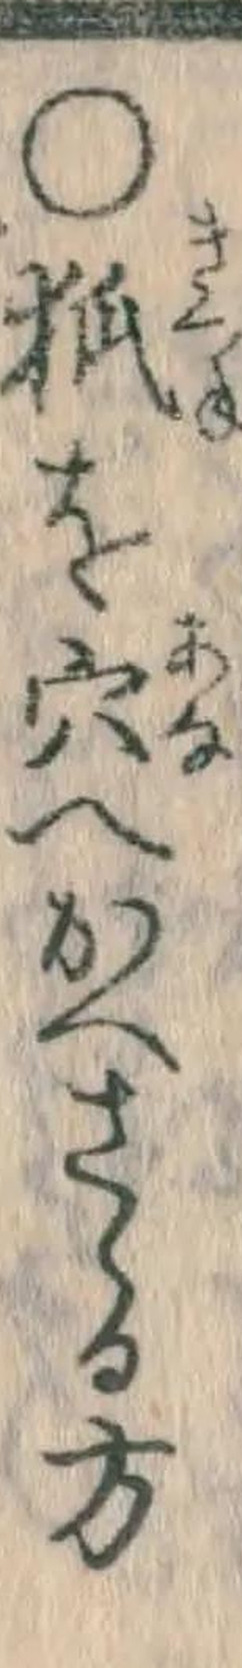○狐を穴へかへさゝる方
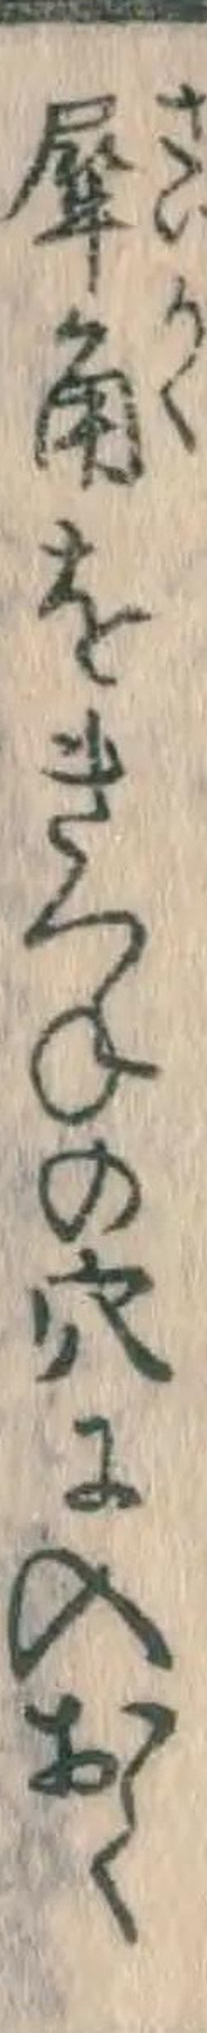犀角をきつねの穴に入おく
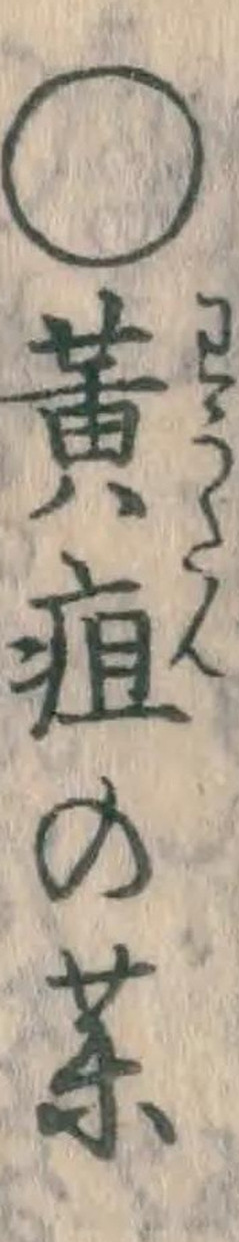○黄疸の薬
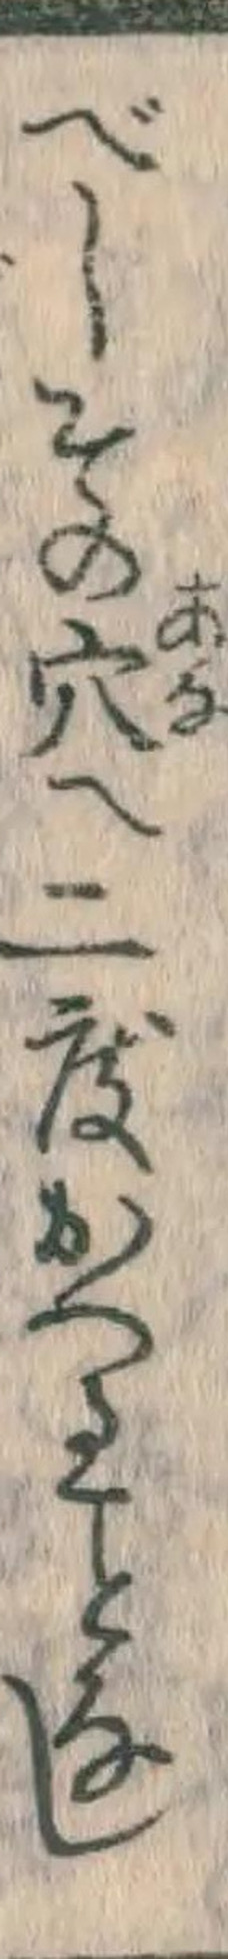べしその穴へ二度かへることなし
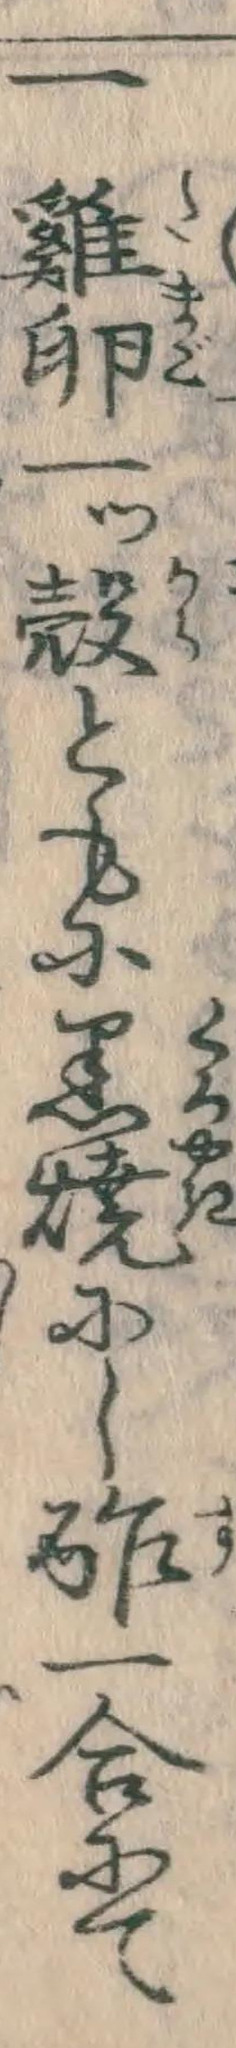一鶏卵一ッ殻ともに黒焼にし酢一合にて
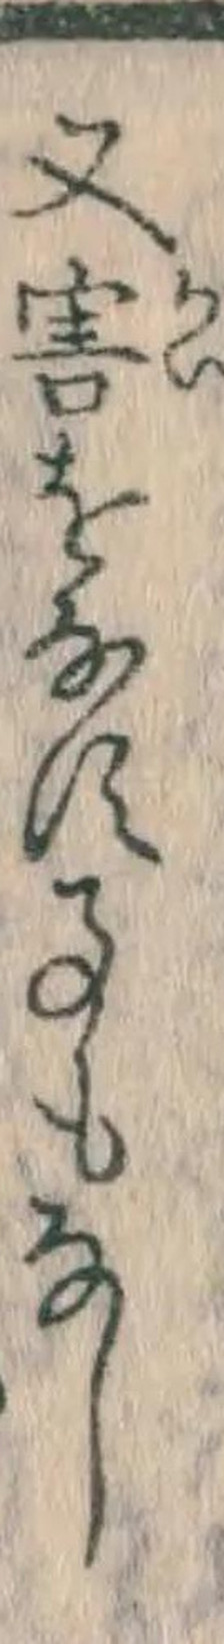又害をなす事もなし
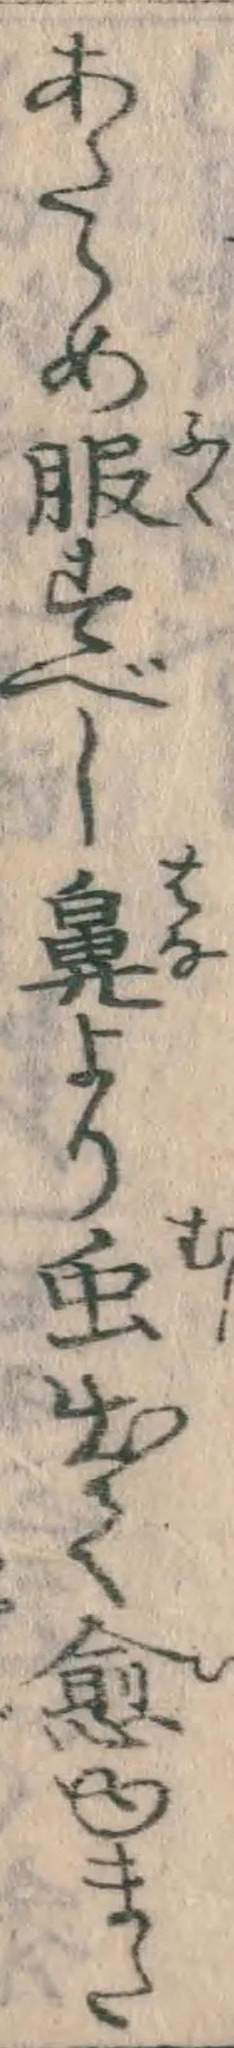あたゝめ服すべし鼻より虫出て愈ゆまた
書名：広益秘事大全 3巻. [4]
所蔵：国立国会図書館 National Diet Library, JAPAN
